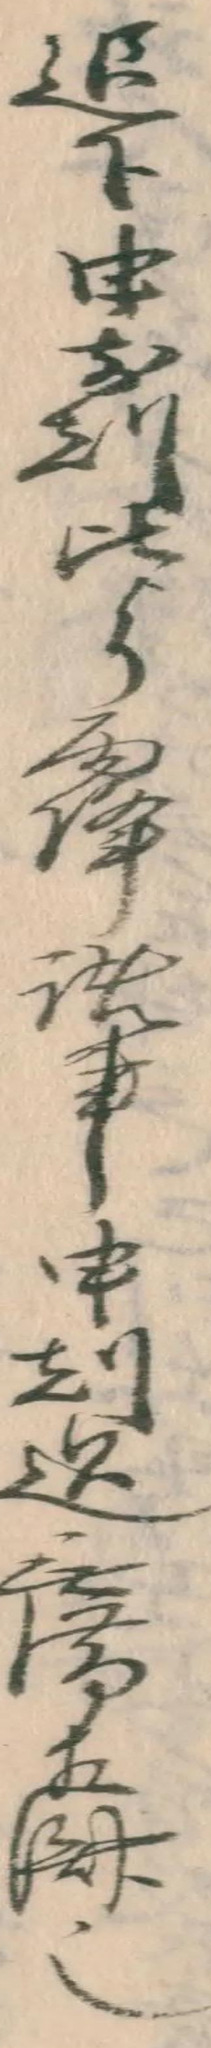退下申前刻比より雨降諸事申刻過無滞相済也
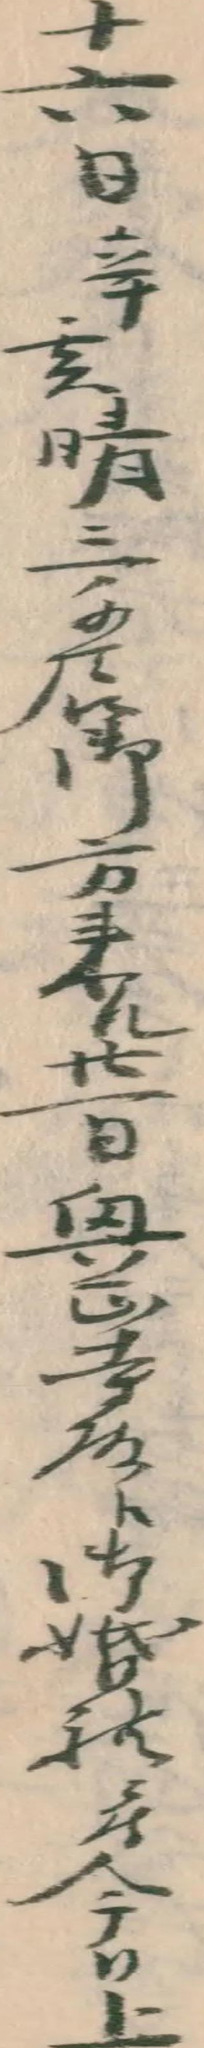十六日辛亥晴三千居御方来ル廿一日興正寺殿え御婚礼ニ付今日上
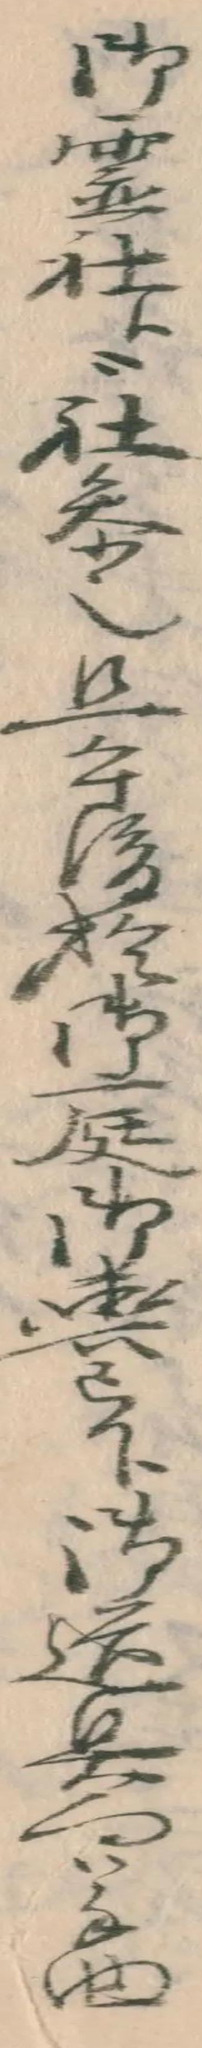御霊社え御社参也且午後於御庭御輿已下御道具向御手回
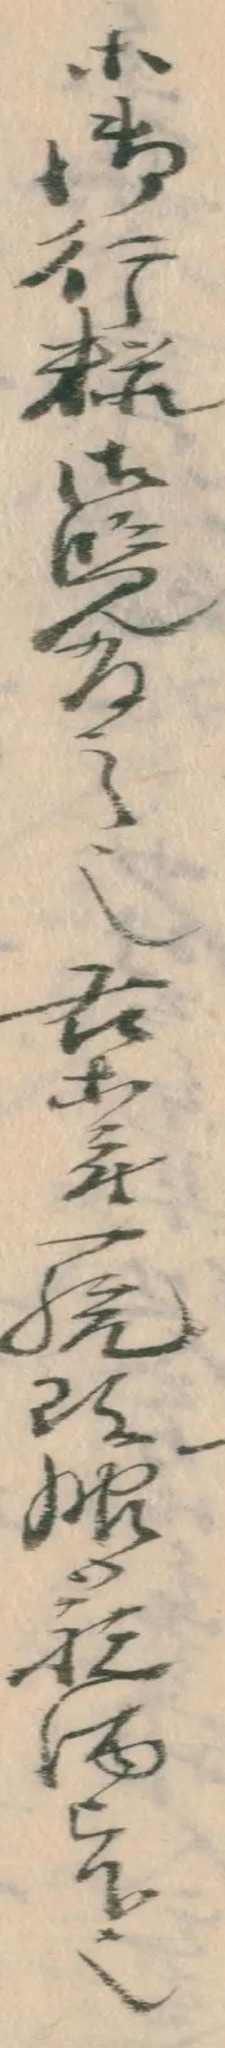等御行粧御覧有之也右等ニ付一統改服御祝酒被下也
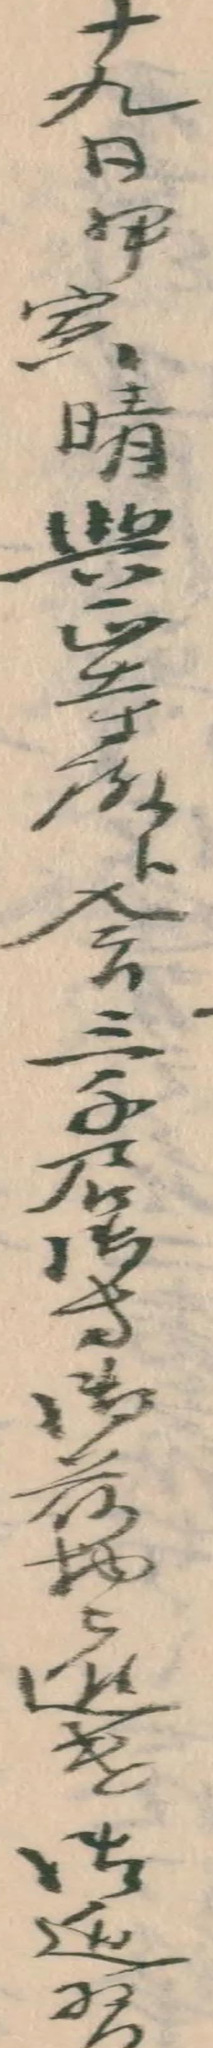十九日甲寅晴興正寺殿え今日三千居御方御荷物被進遣御近習
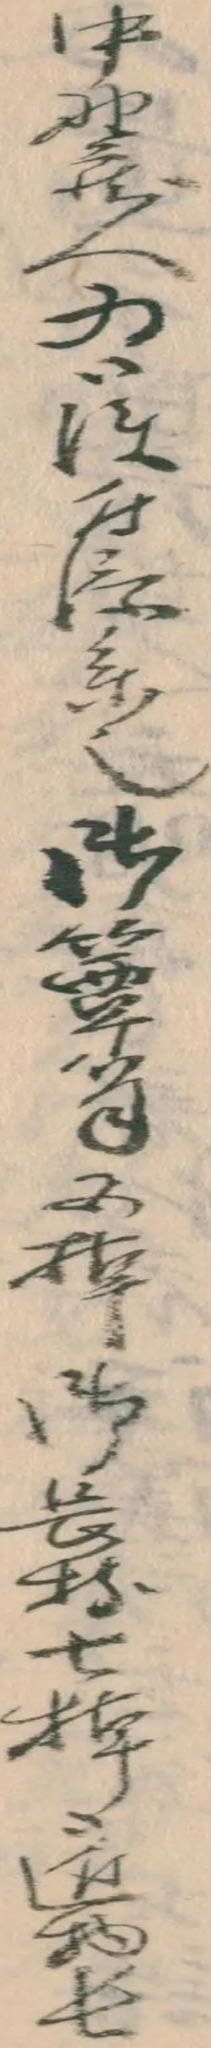中野蔵人為御役付添参也御箪笥五棹御長持七棹御近物長
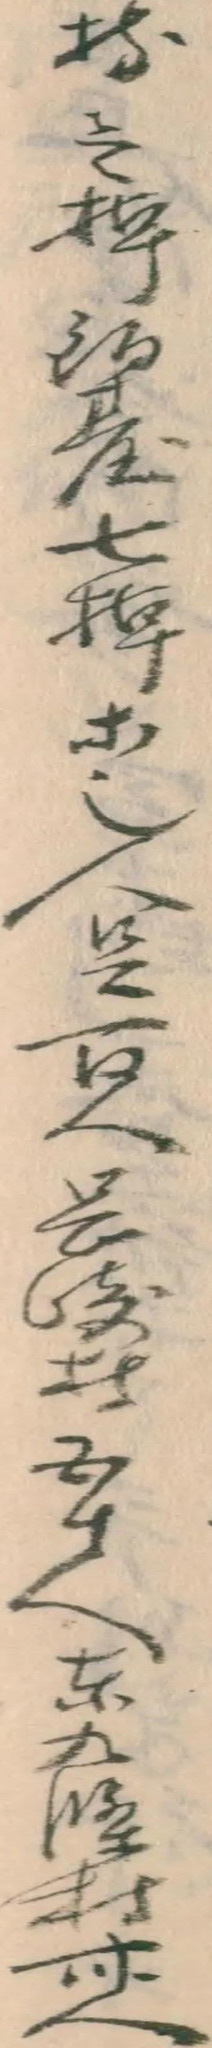持壱棹釣臺七棹等也人足百人岡崎村五十人東九條村丗人
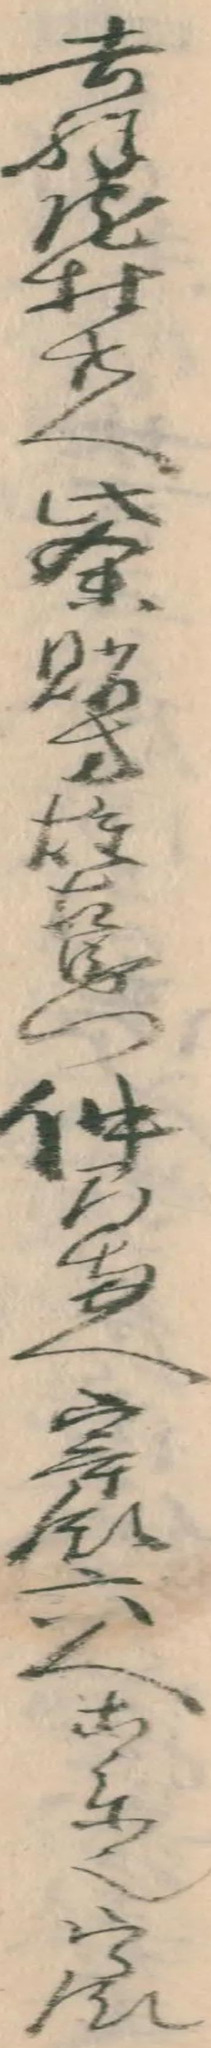吉祥院村廿人此余賄方雄左衛門仲間両人宰領六人等参也領
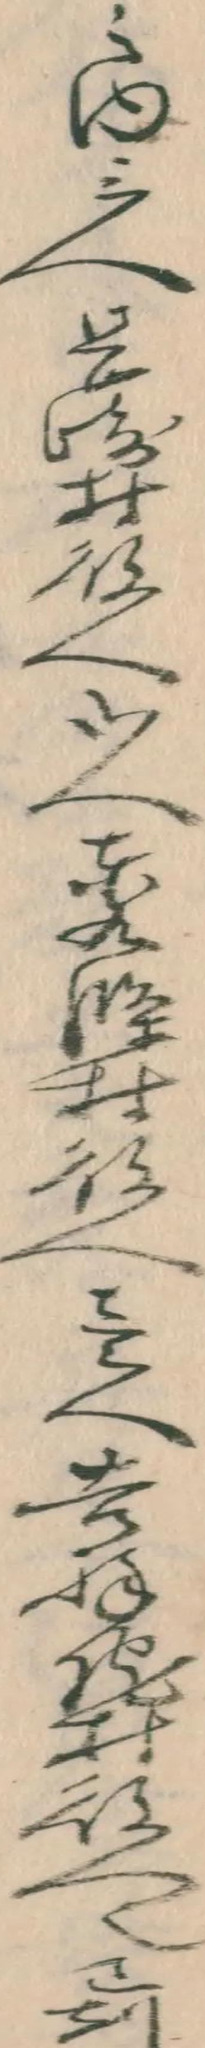之内三人岡崎村役人弐人東九條村役人壱人吉祥院村役人也巳刻
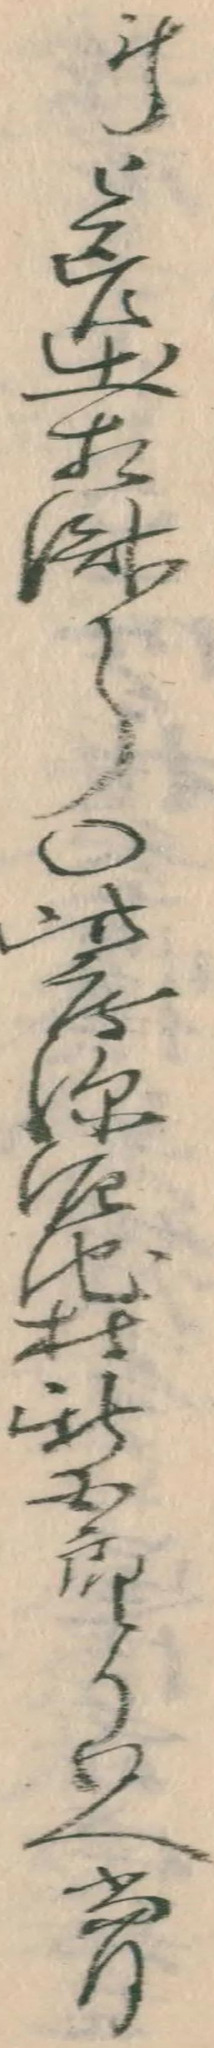斗被差出相済了○此度深泥池村新五郎より同人當月
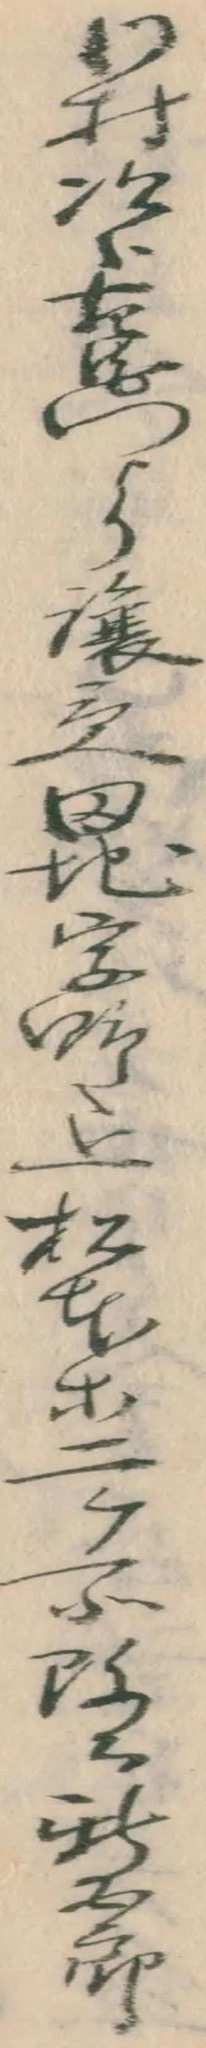同村次郎左衛門より譲受田地字野々上松本等二ケ所改而新五郎
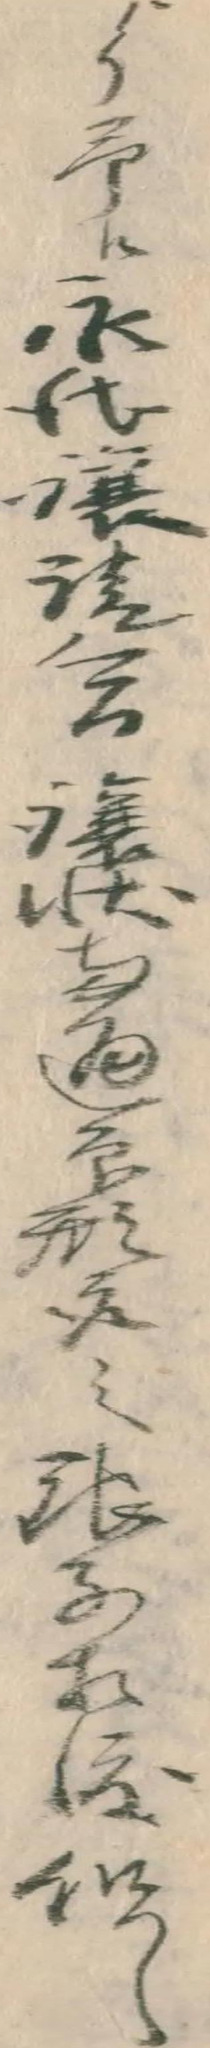より予え永代譲請今日譲状両通印形取之銀子相渡但し
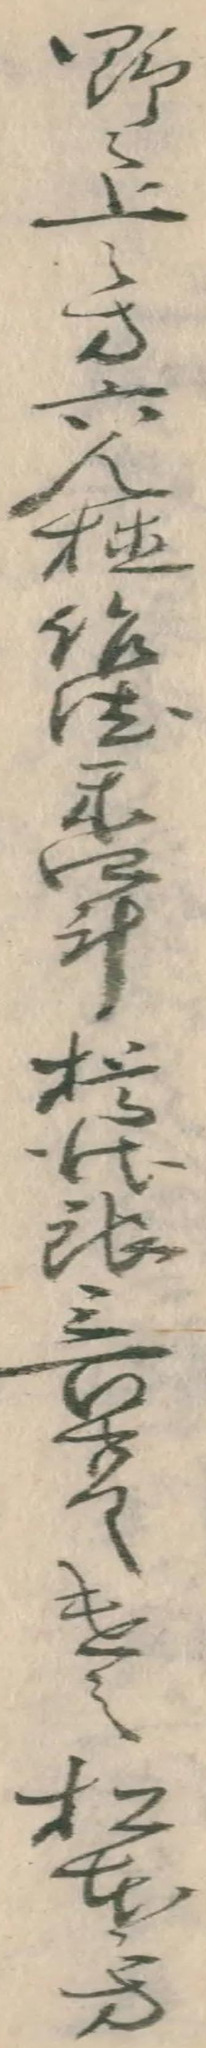野々上之方六人植作植米四斗樽代銀三百廿匁貫遣也松本之方
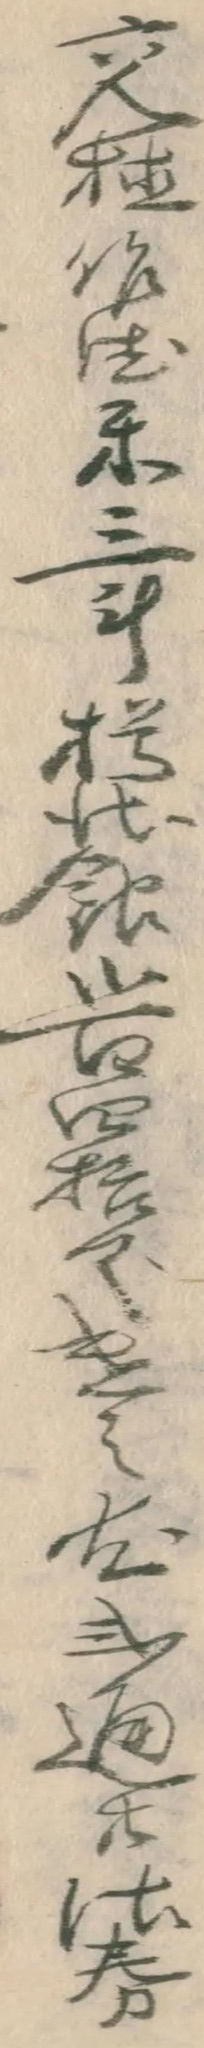六人植作徳米三斗樽代銀弐百四拾匁遣之尤弐通共沽券
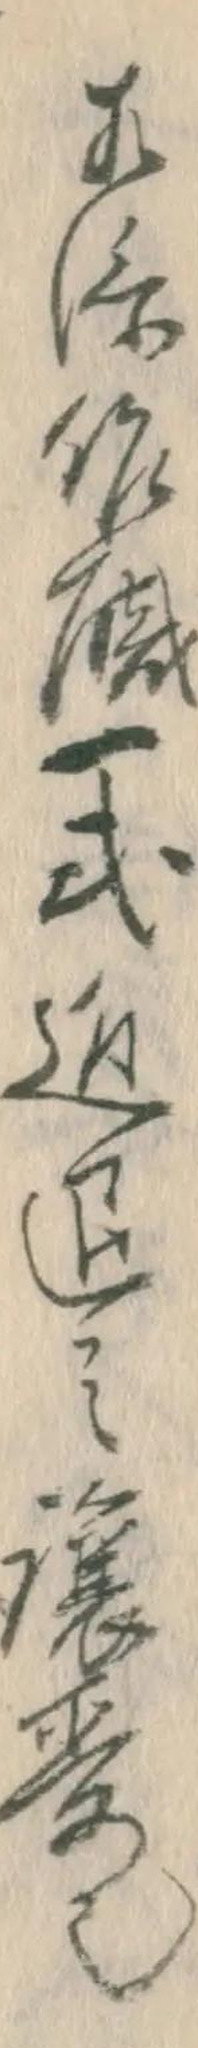相添作職一式近退之譲受也
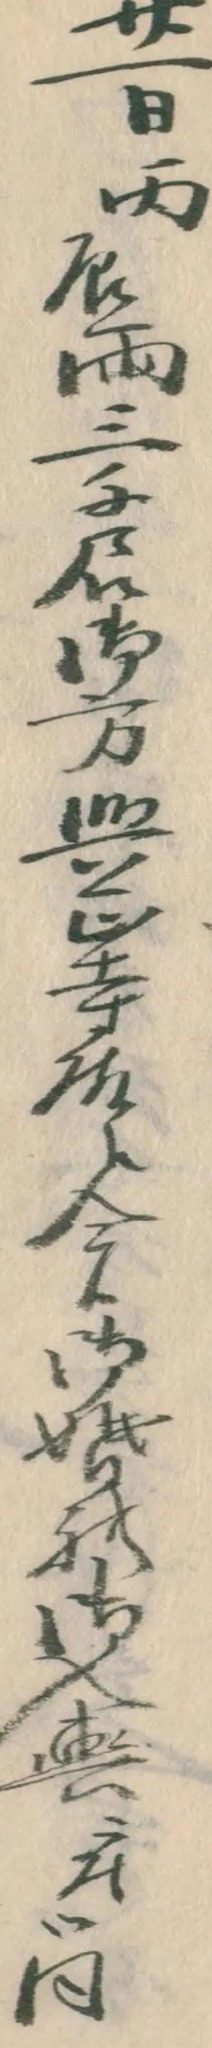廿一日丙辰雨三千居御方興正寺殿え今日御婚礼御入輿ニ付御同
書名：賀茂社記録. 第66冊
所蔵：国立国会図書館 National Diet Library, JAPAN
